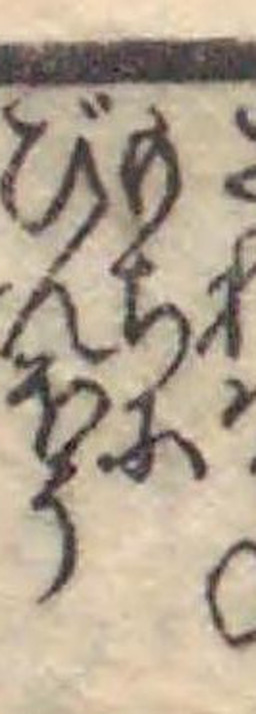びんほう
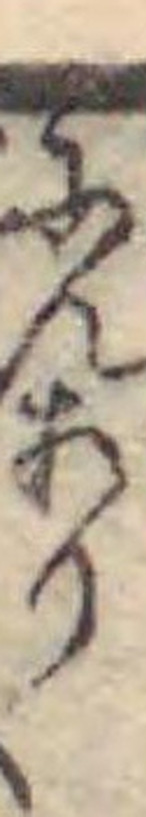にんあり
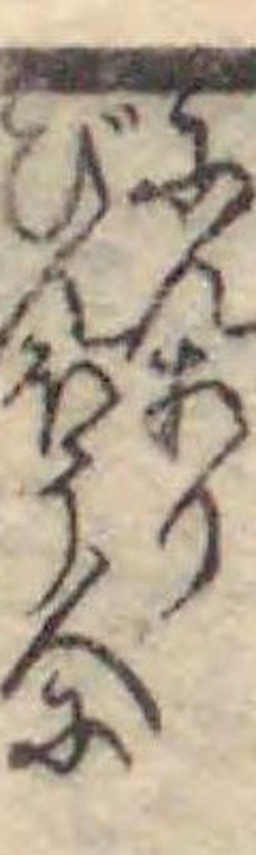びんほう人に
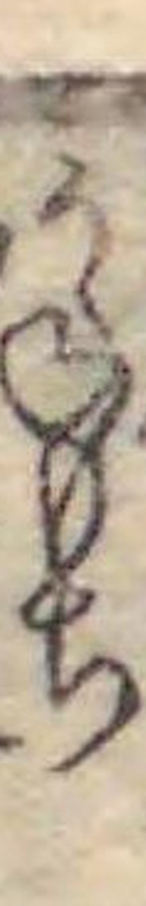かねもち
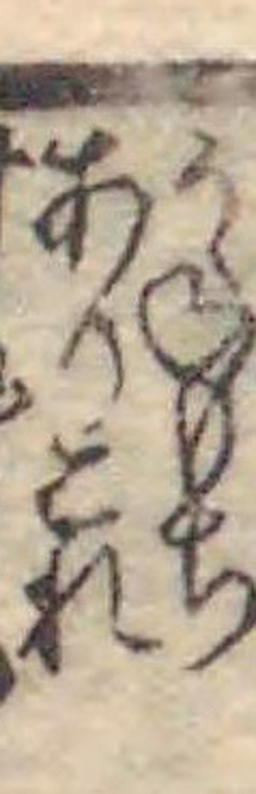ありこれ
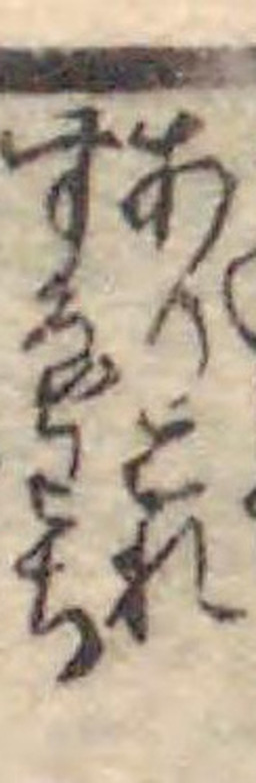すなわち
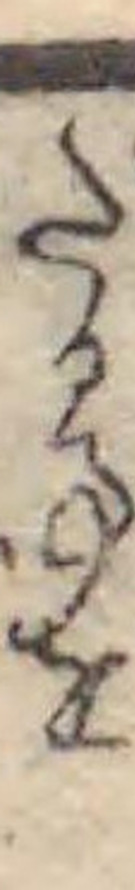たる事を
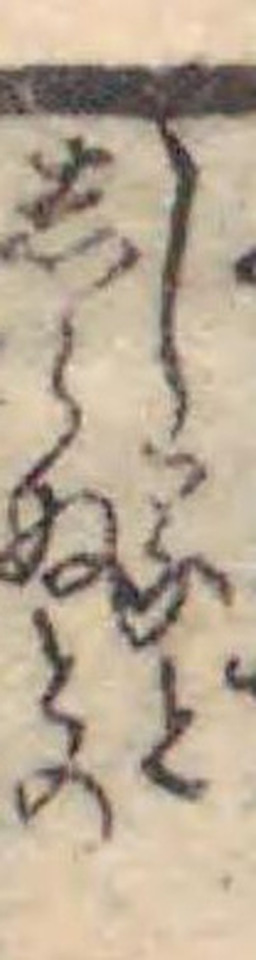しらぬとの
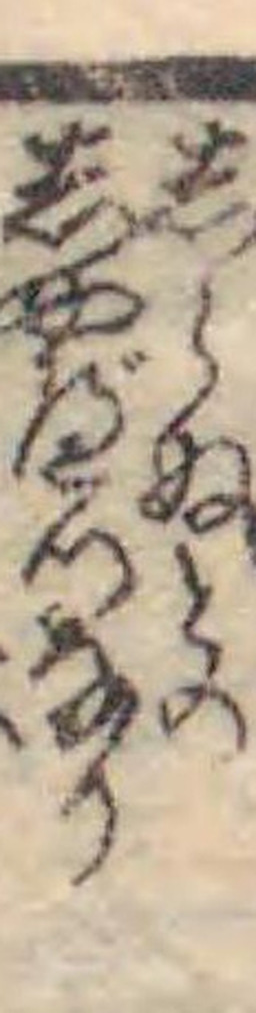しやべつなり
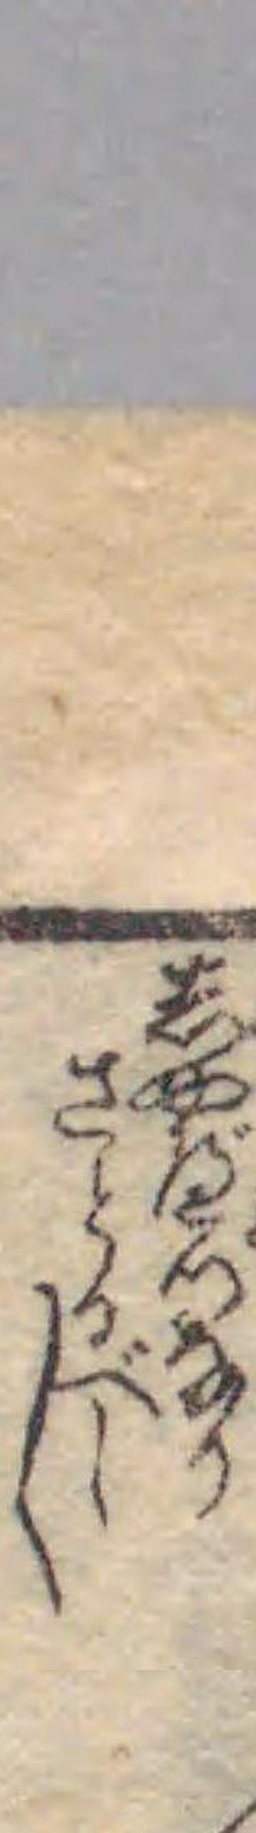さとるべし
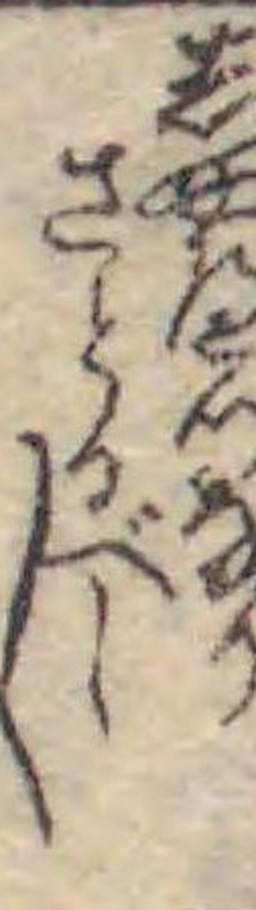さとるべし
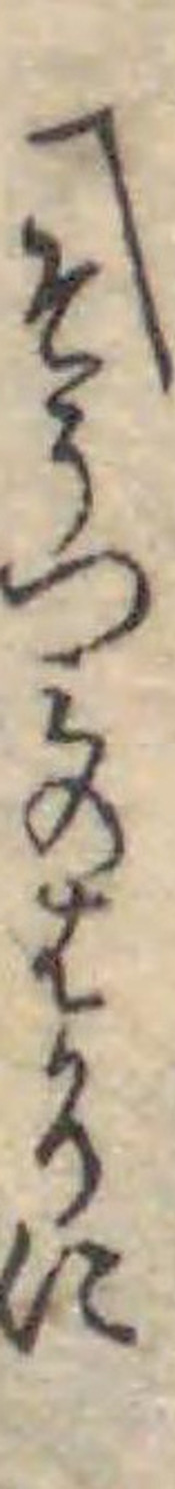〽そうつみのはかりに
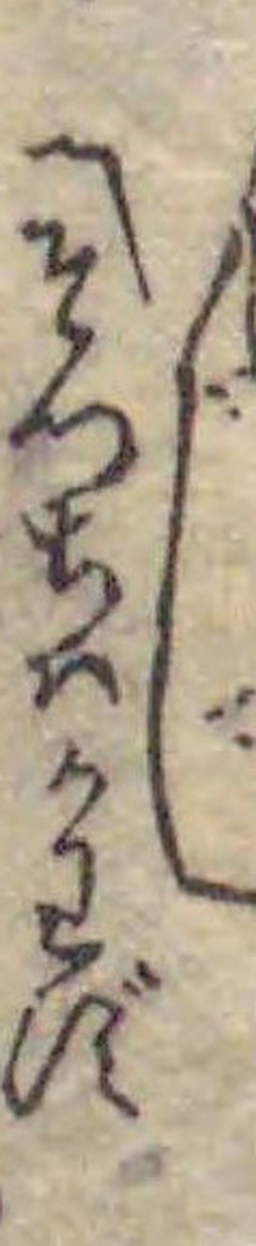〽そつちはかわず
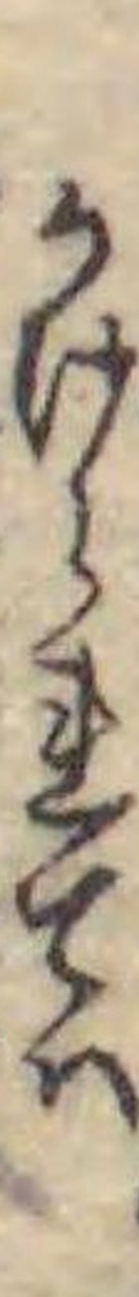かけられては
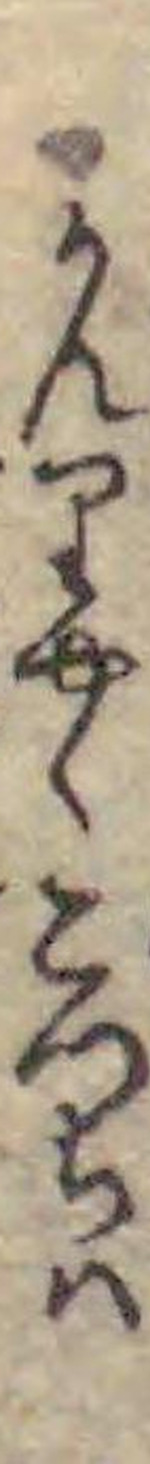かんりやくこつちは
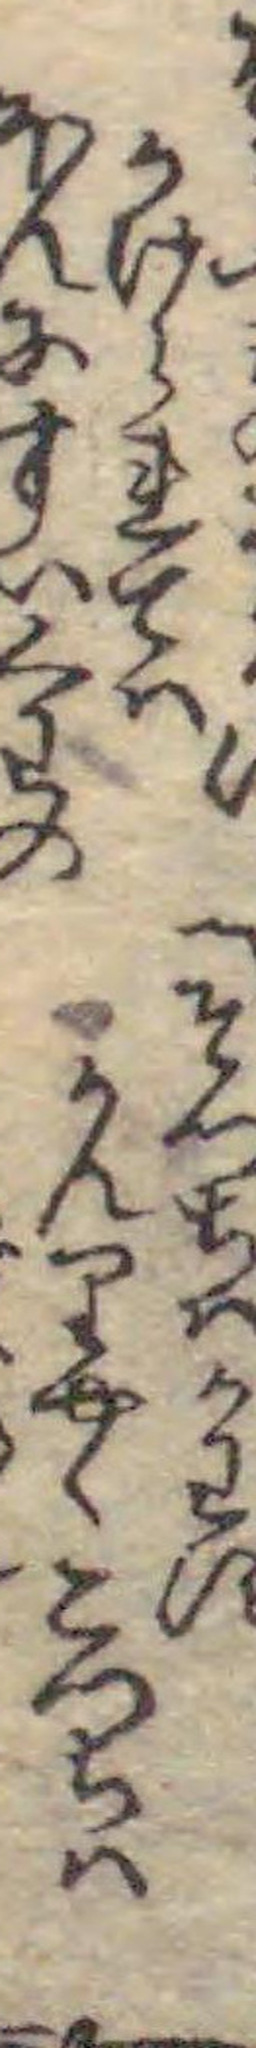ほんにすいくわの
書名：人心鏡写絵 : 3巻
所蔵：国立国会図書館 National Diet Library, JAPAN
